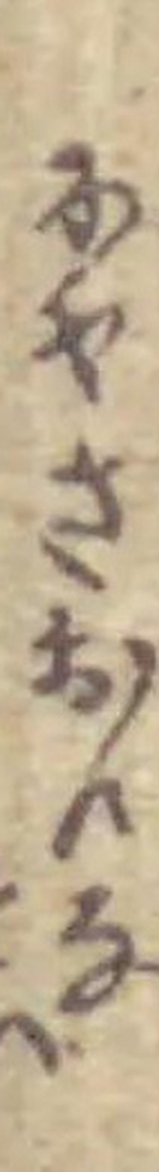にやさおんな
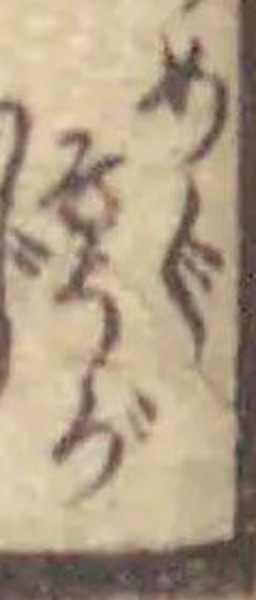そうづ
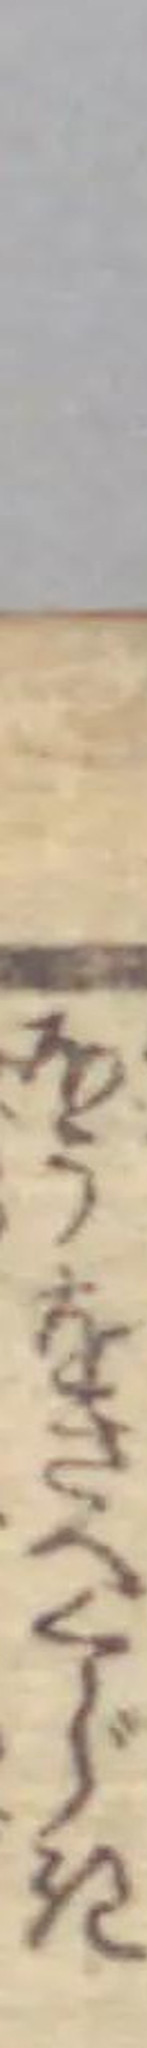ほうをさへくじき
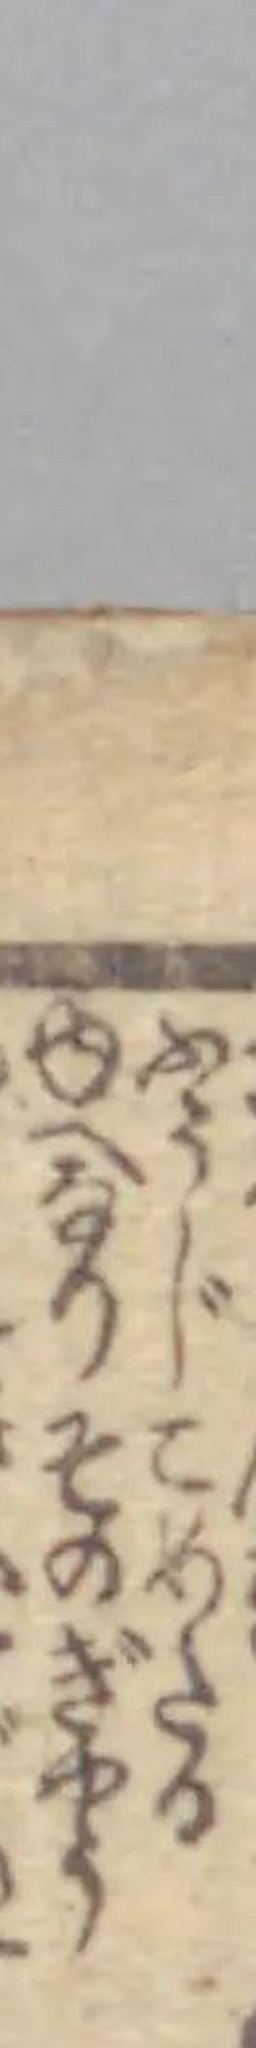ゆへなりそのぎやう
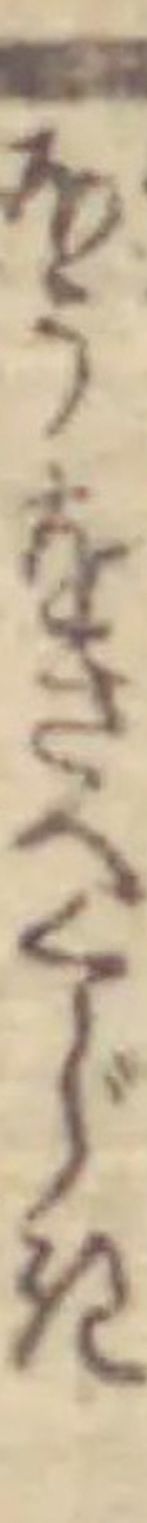ほうをさへくじき
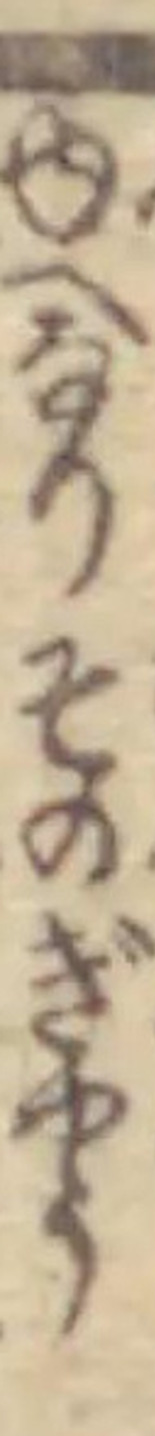ゆへなりそのぎやう
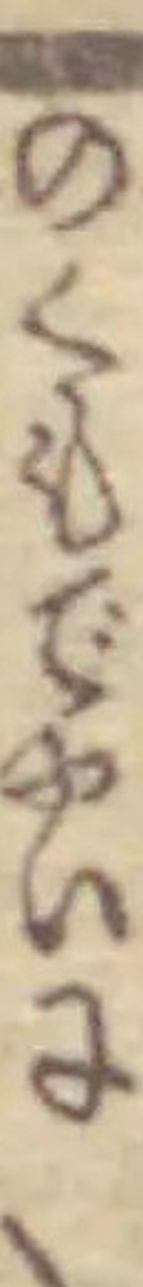のくもでやいに
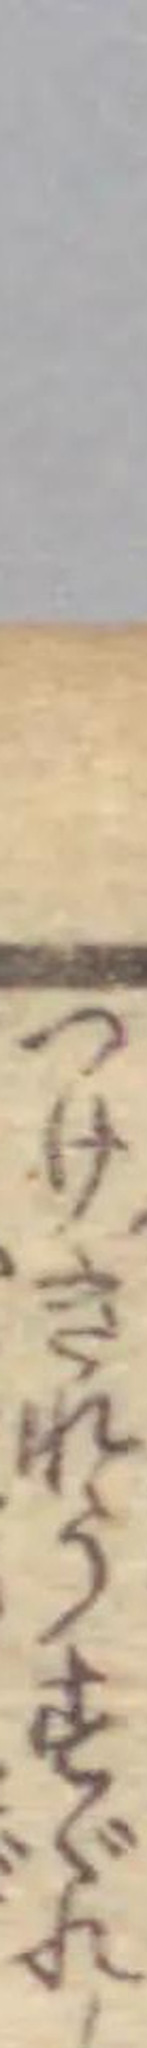つけきれうすぐれし
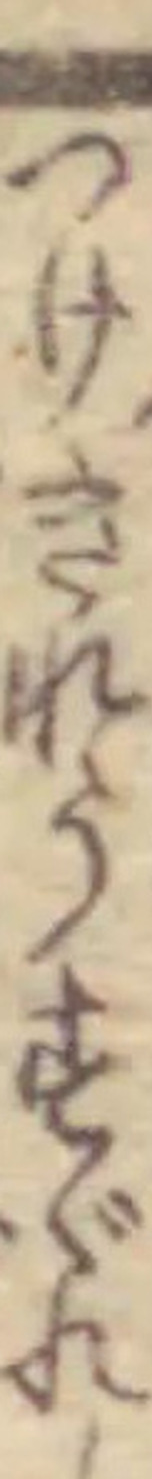つけきれうすぐれし
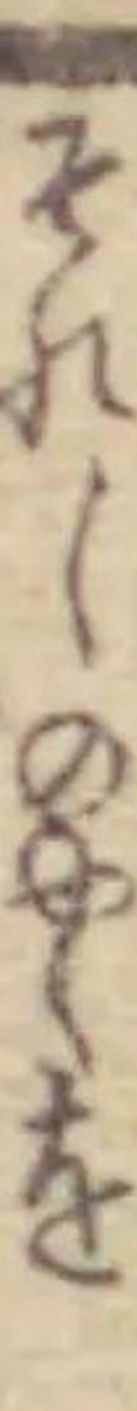それ〳〵のやくを
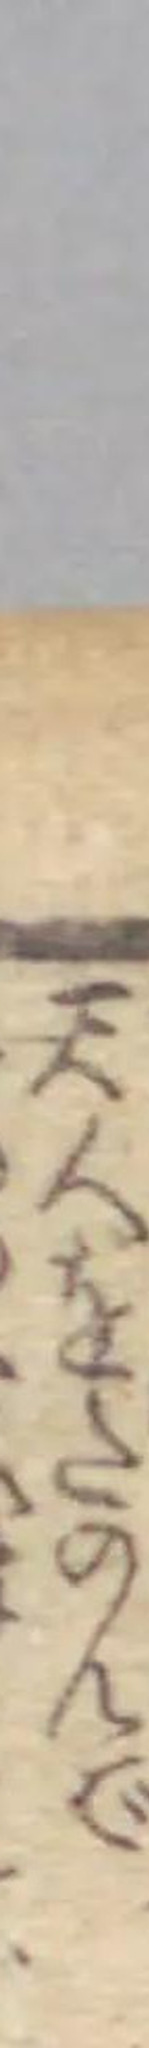天人をたのんで
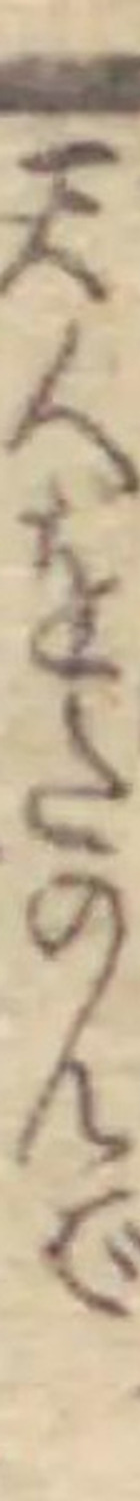天人をたのんで
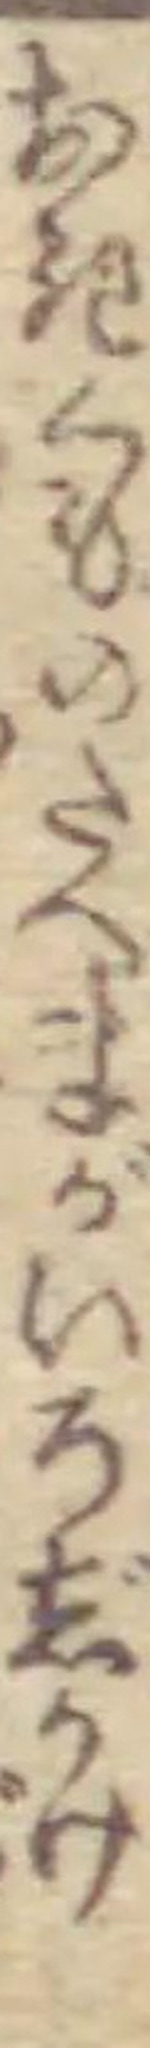おきくものたへまがいろじかけ
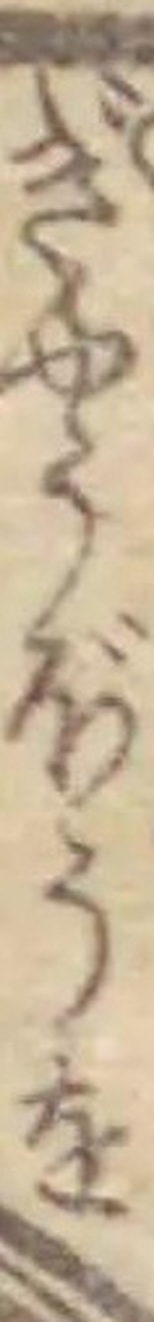ぎやうほうを
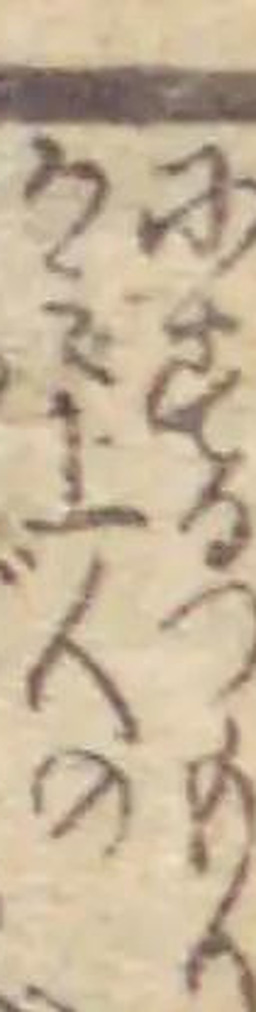かみ上人の
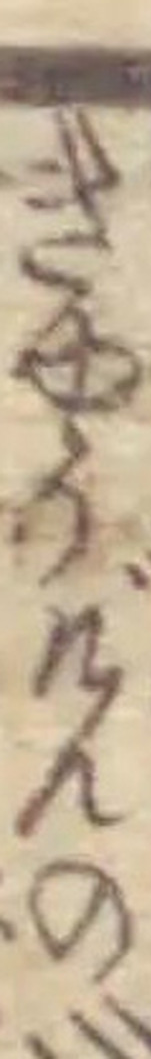きやうげんの
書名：雨宮風宮出儘略縁記 3巻
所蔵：国立国会図書館 National Diet Library, JAPAN
